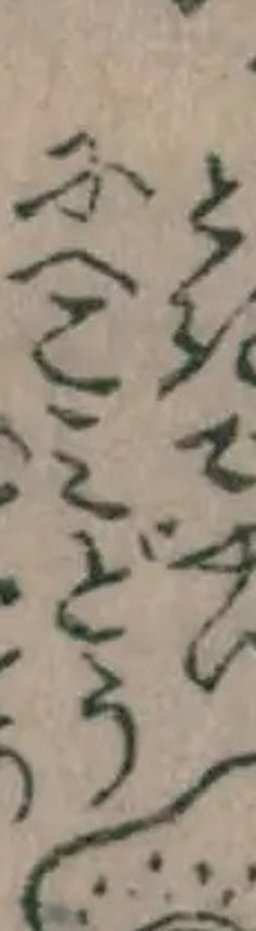にへこみどう
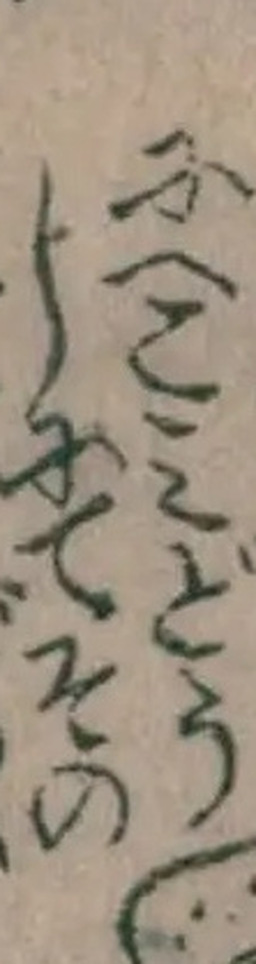しにてその
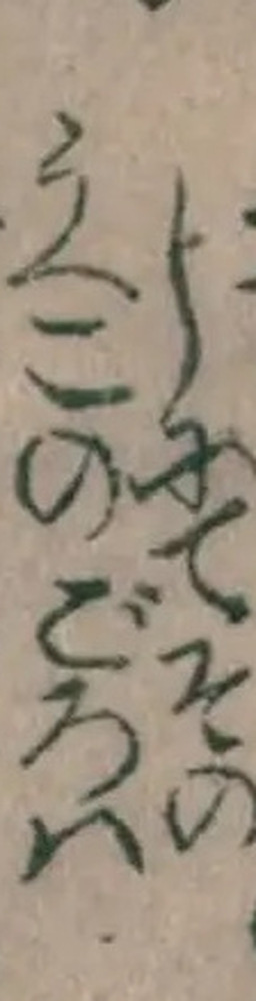うへこのごろは
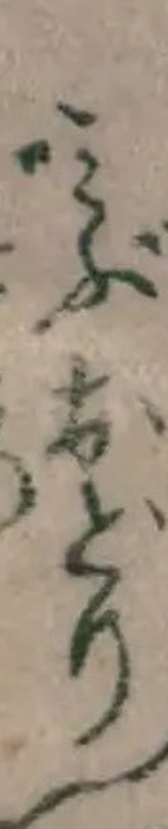みぶおどり
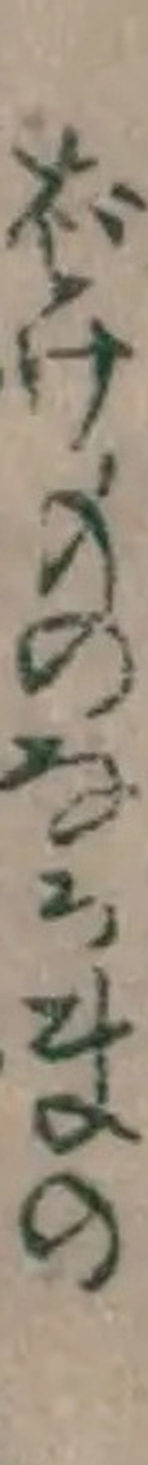ばけものなかまの
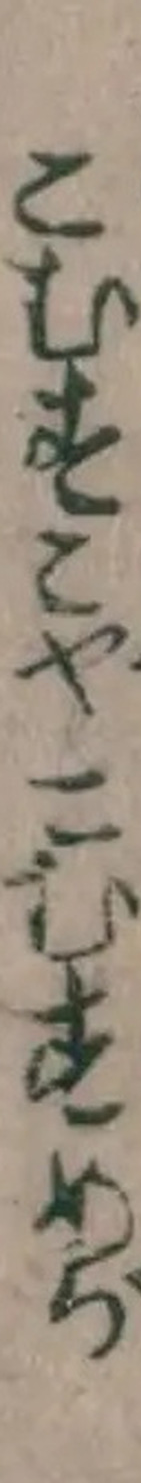こむすこやこむすめが
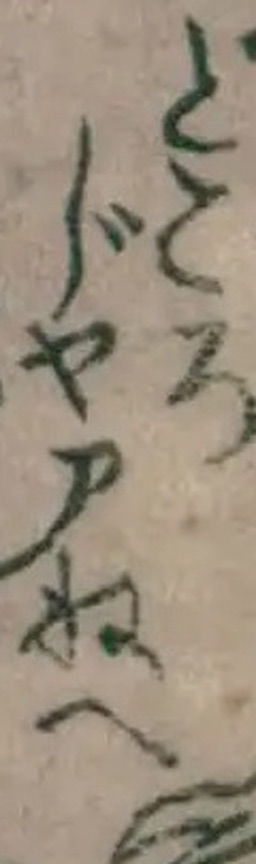じやアねへ
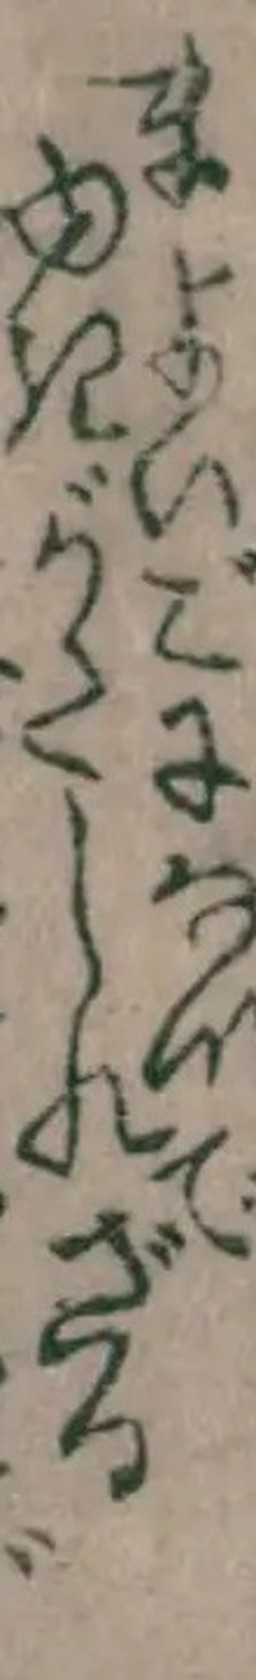ゆきがたしれざる
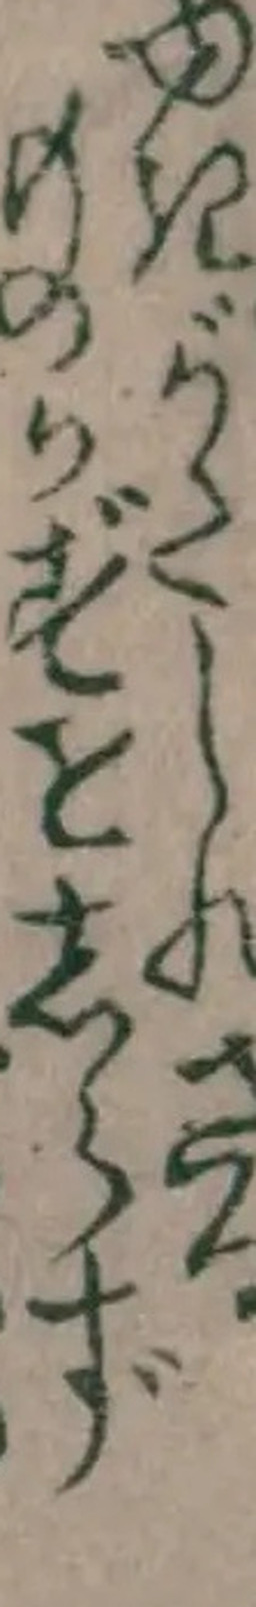ものかずをしらず
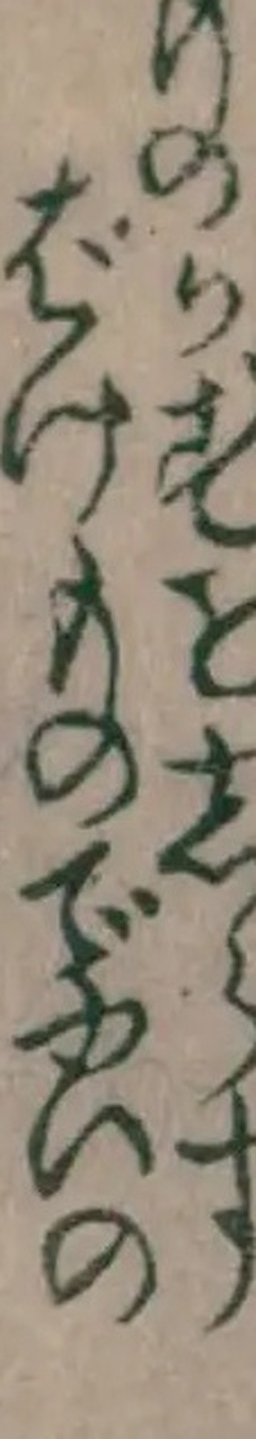ばけものでやいの
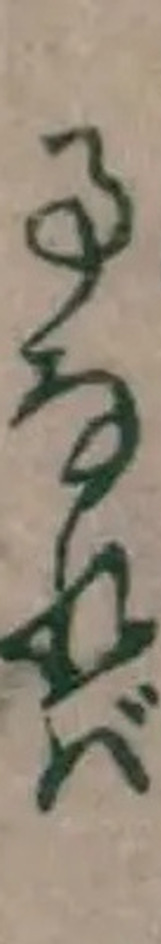事なれば
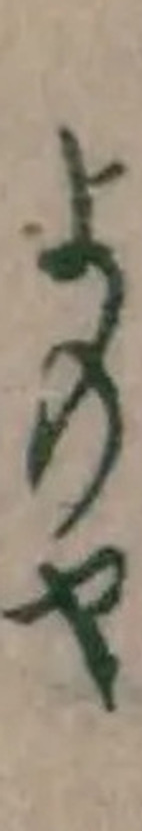よもや
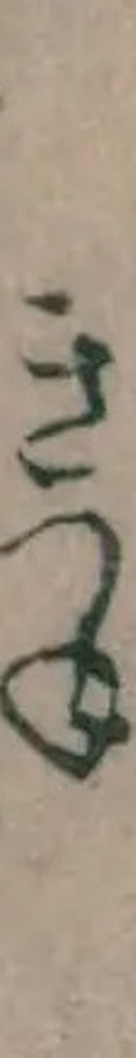きつね
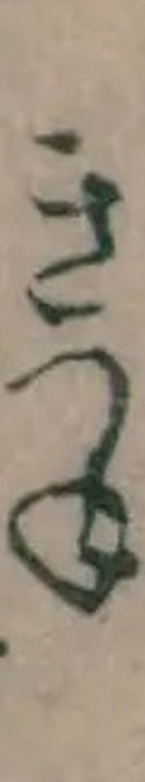きつね
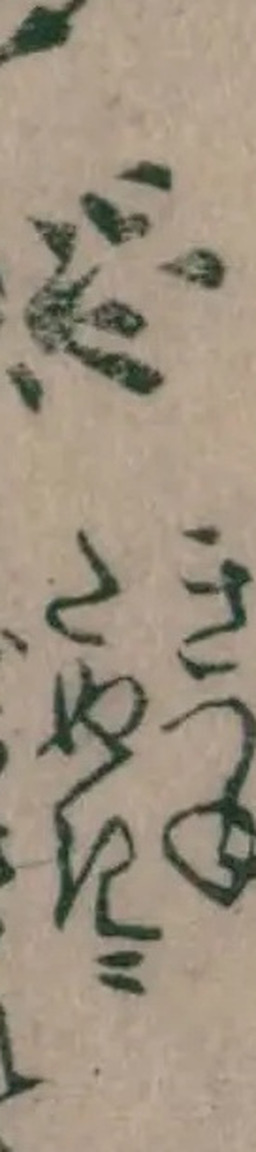たぬきに
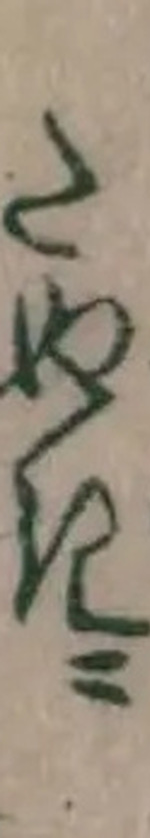たぬきに
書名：信有奇怪会
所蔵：国立国会図書館 National Diet Library, JAPAN
